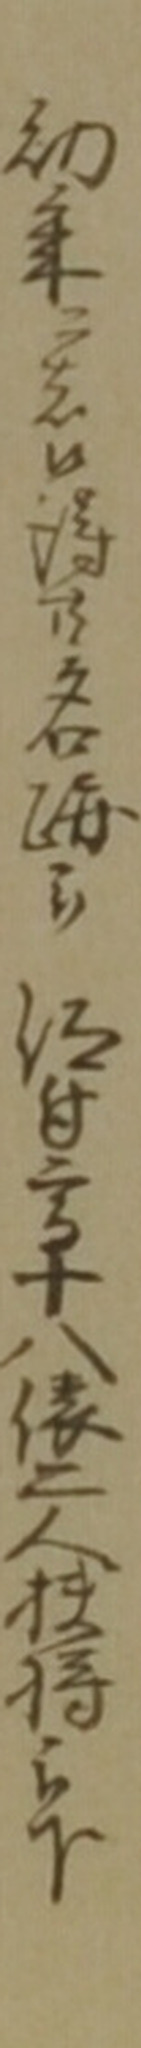幼年ニ者候得共名跡被仰付高十八俵二人扶持被下

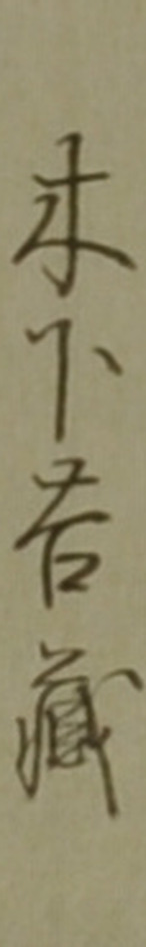木下吉蔵
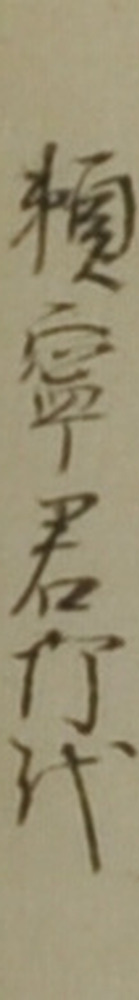頼寧君御代
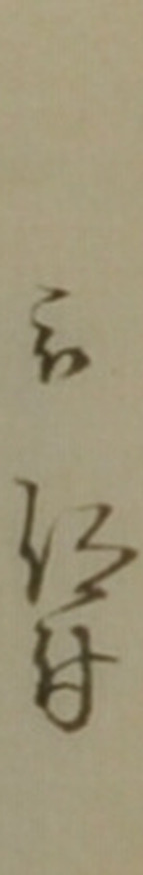被仰付
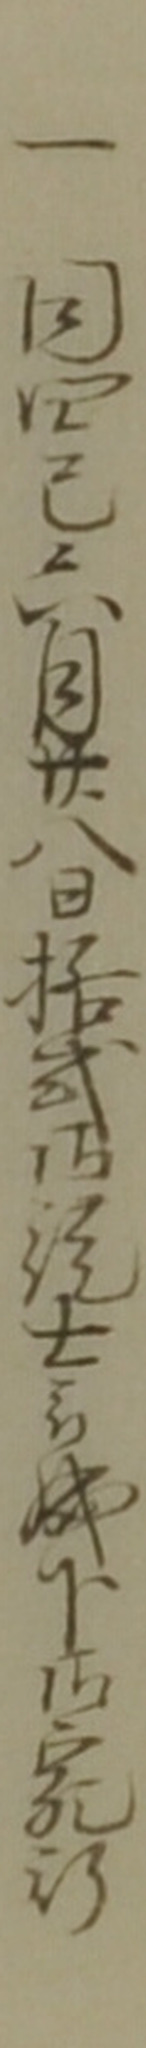一同四巳六月廿八日格式御徒士被成下御宛行
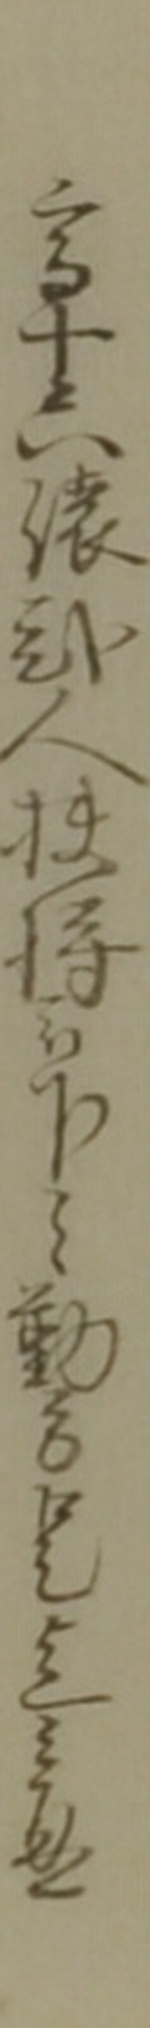高十六俵弐人扶持被下之勤方是迄之通
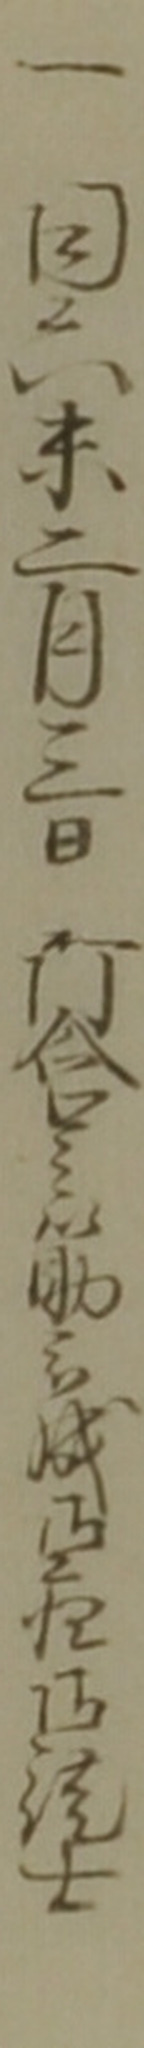一同六未二月三日御含之筋被成御座御徒士
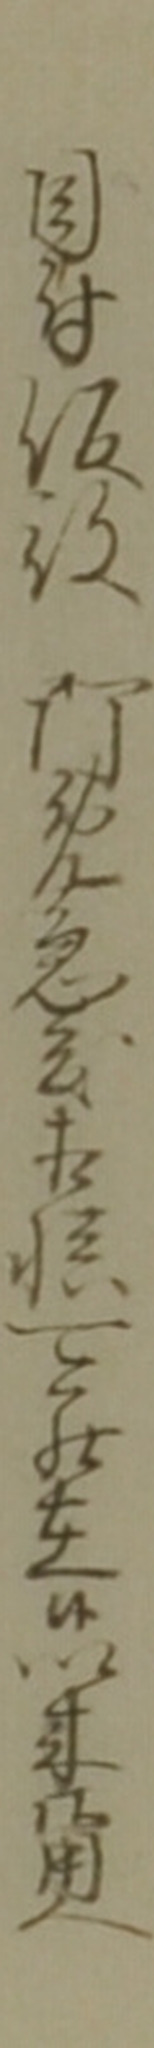目付仮役御免急度相慎可罷在候以来御用人
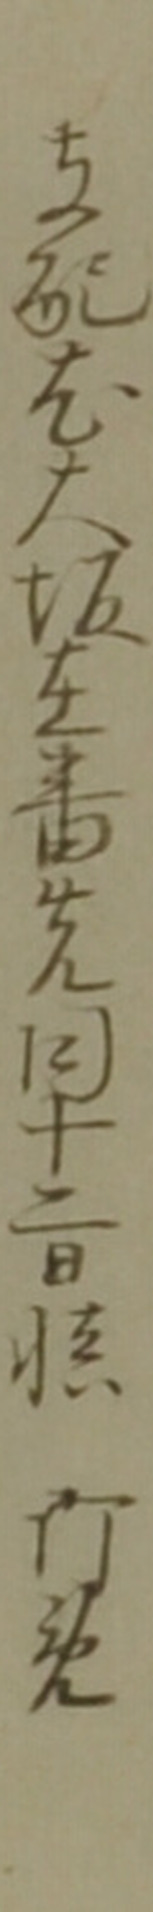支配老大坂在番先同十二日慎御免
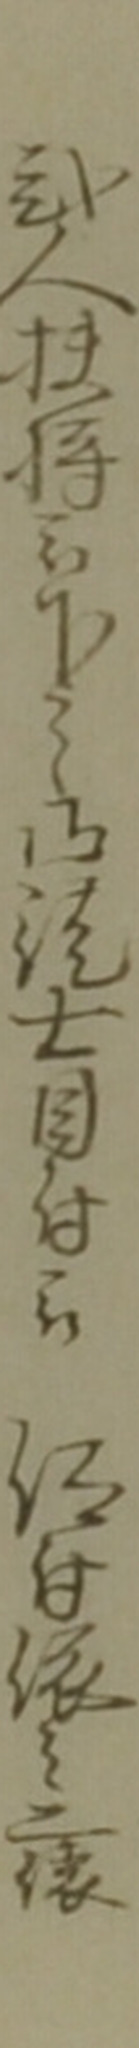弐人扶持被下之御徒士目付被仰付依之二俵
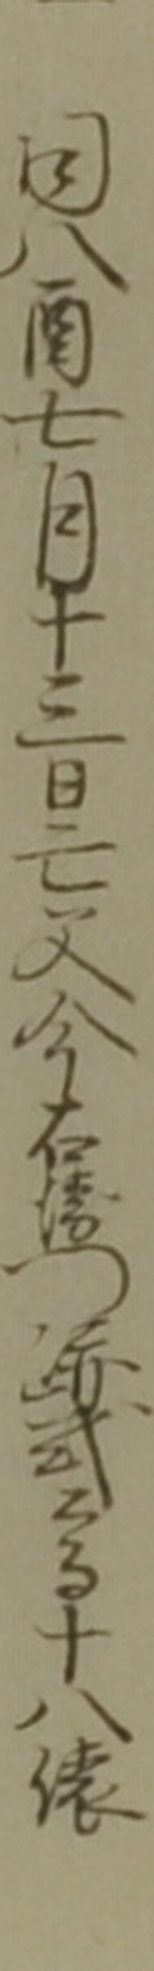一同八酉七月十三日亡父今右衛門跡式高十八俵
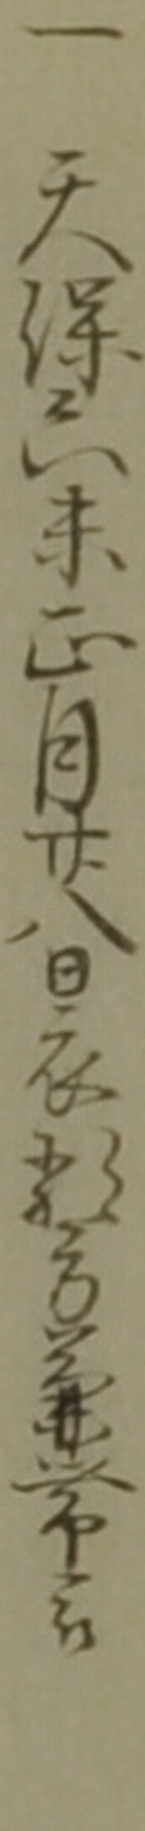一天保六未正月廿八日衣類方兼帯被
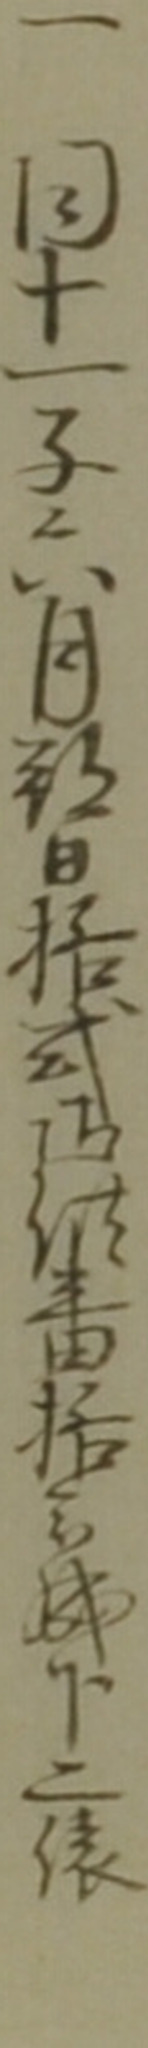一同十一子六月朔日格式御供番格被成下二俵
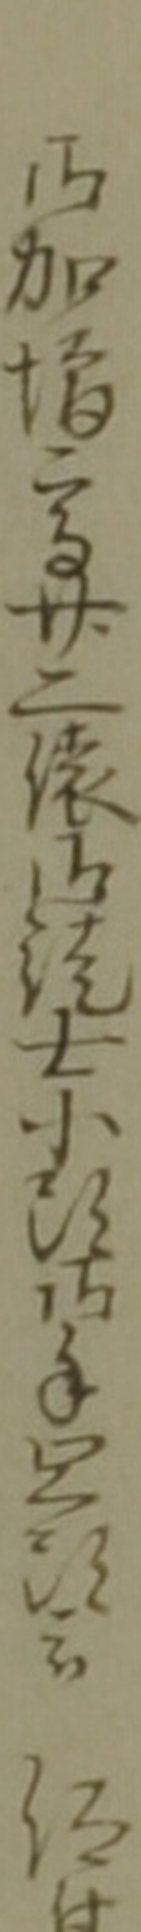御加増高廿二俵御徒士小頭御手廻頭被仰付
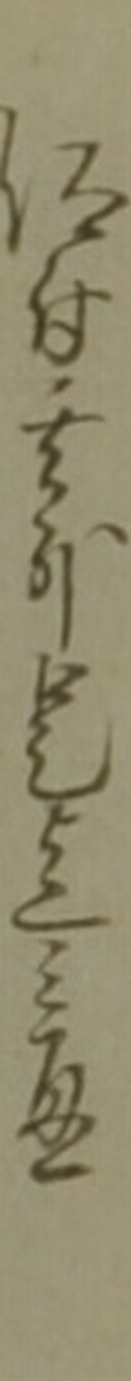仰付其外是迄之通

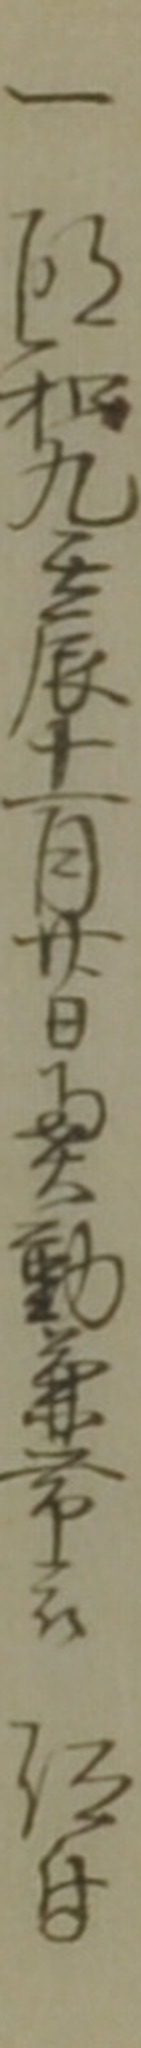一明和九壬辰十一月廿日奥勤兼帯被仰付
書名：無足諸士勤仕録（六）
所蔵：伊那市立高遠町図書館・合同会社AMANE
